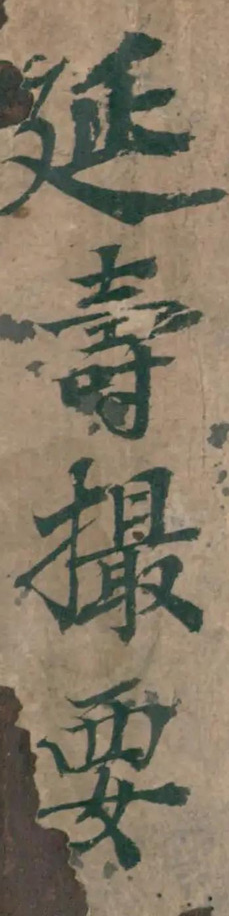延寿撮要

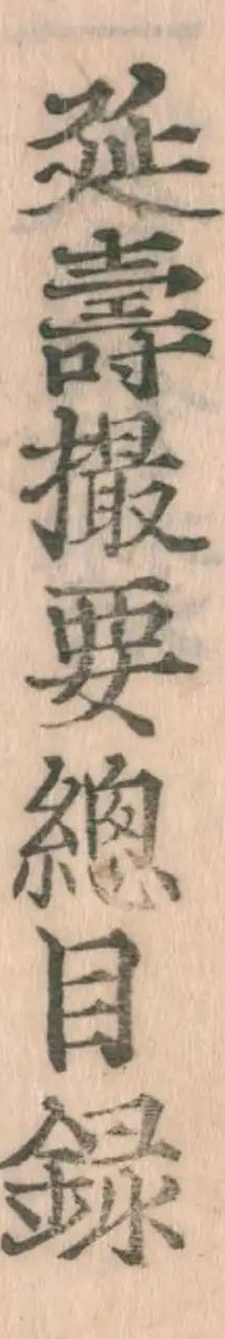延寿撮要総目録
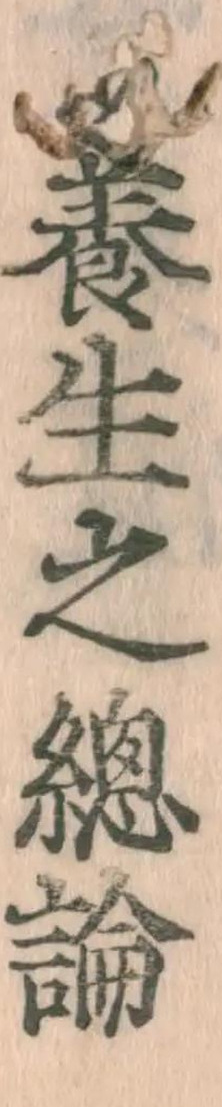養生之総論
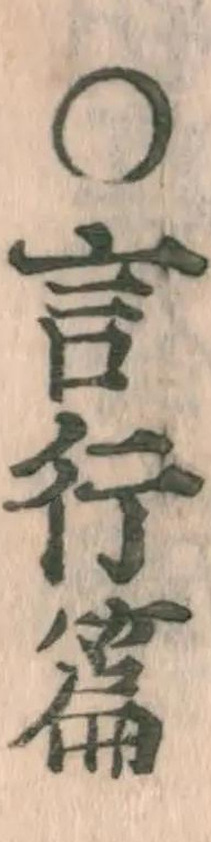〇言行篇
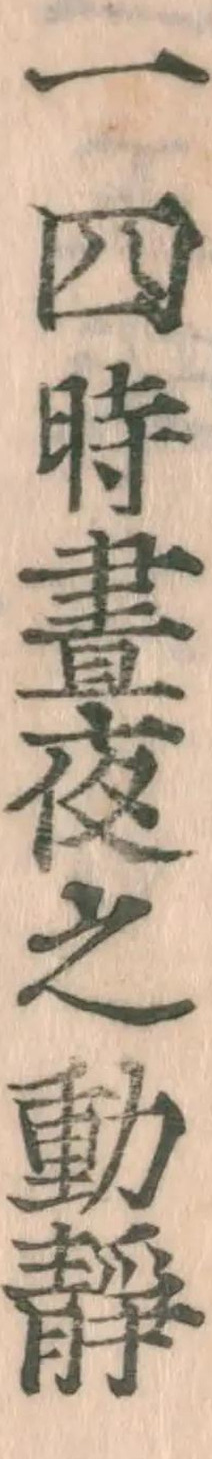一四時昼夜之動静
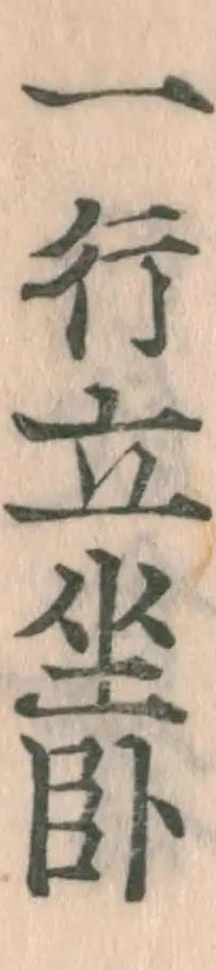一行立坐臥
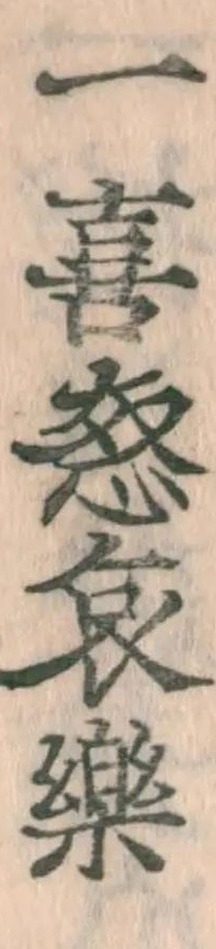一喜怒哀楽
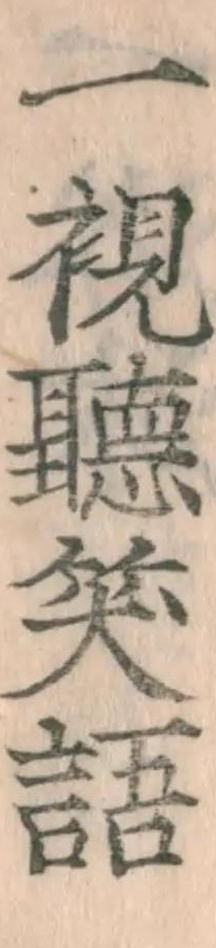一視聴笑語
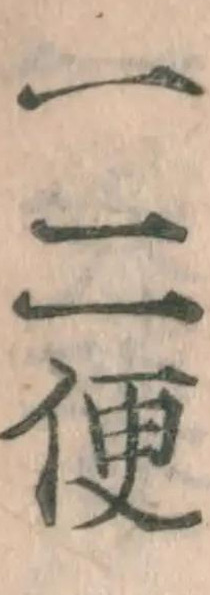一二便

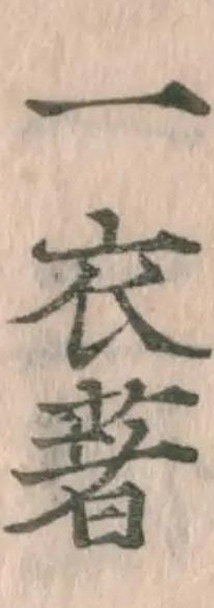一衣著
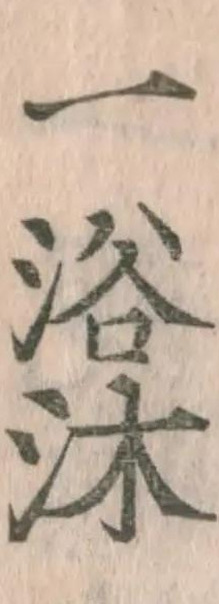一浴沐
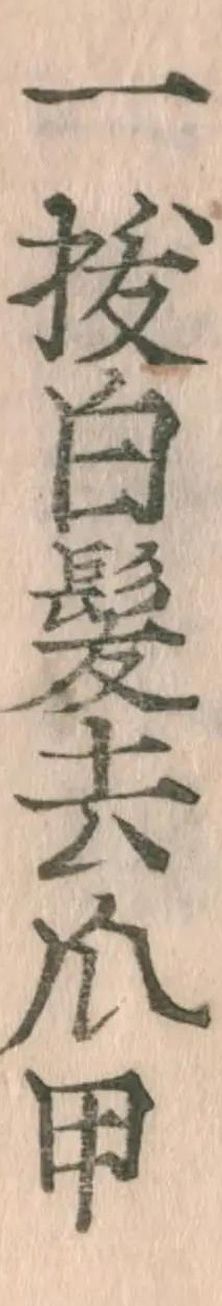一抜白髪去爪甲
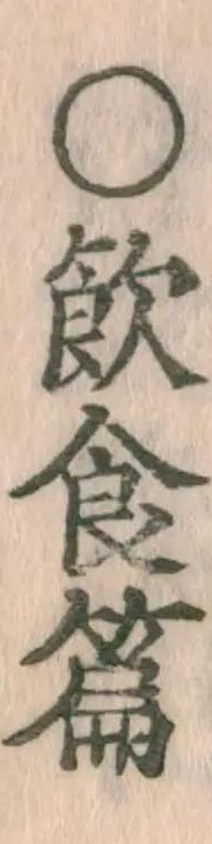〇飲食篇
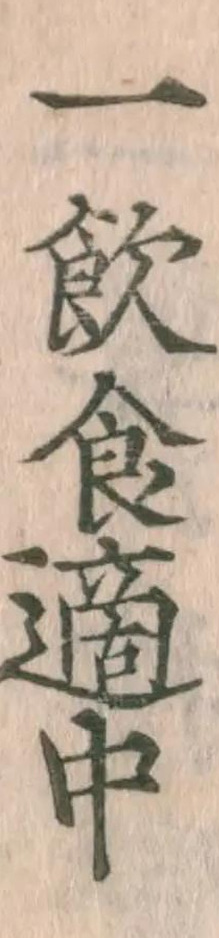一飲食適中
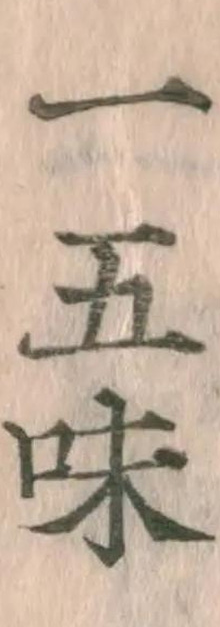一五味
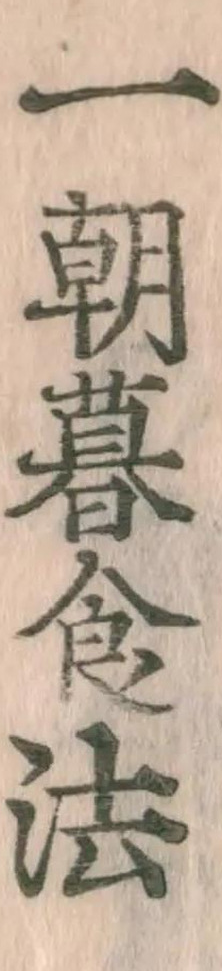一朝暮食法
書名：延壽撮要
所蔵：国立国会図書館 National Diet Library, JAPAN
